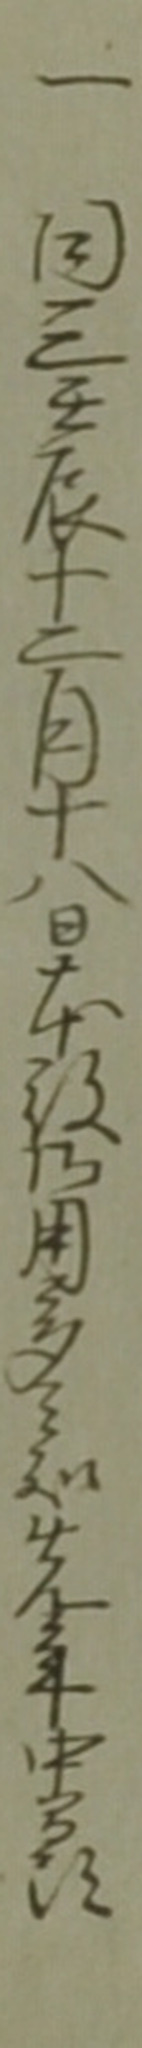一同三壬辰十二月十八日本役御用多之処先年中間頭
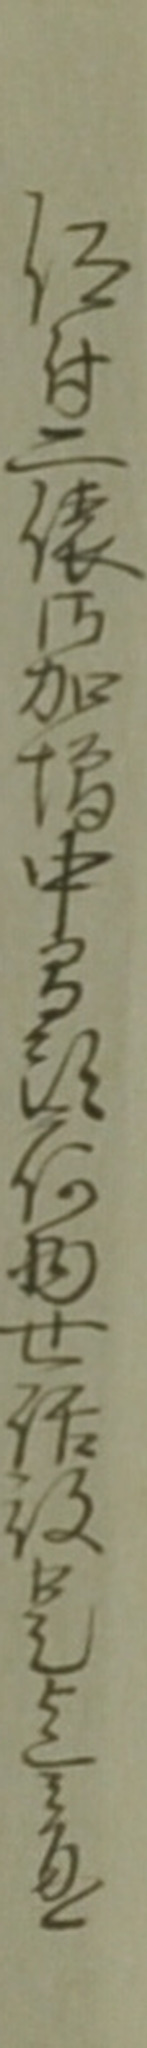仰付二俵御加増中間頭荷物世話役是迄之通
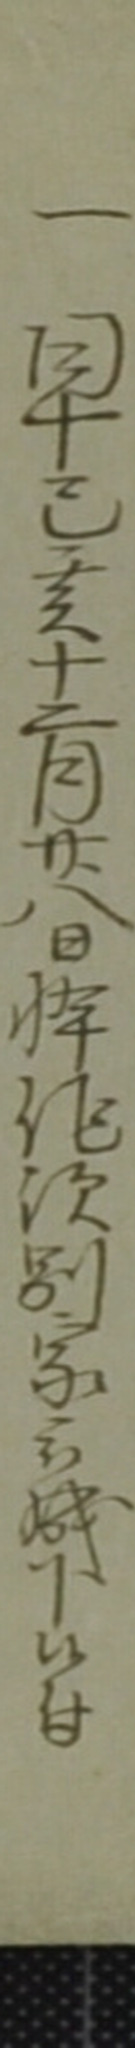一同十己亥十二月廿八日忰作次別家被成下候付
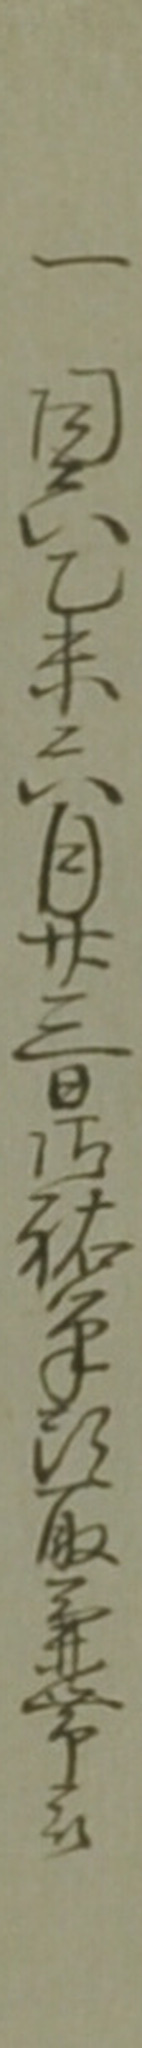一同六乙未六月廿三日御祐筆頭取兼帯被
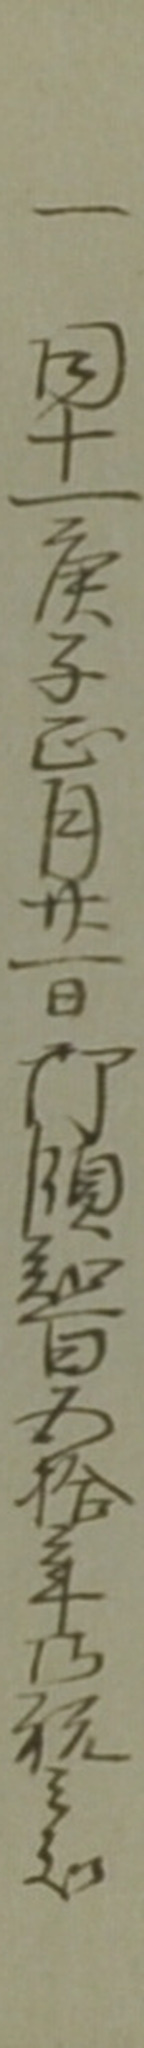一同十一庚子正月廿一日御領知百五拾年御祝之処
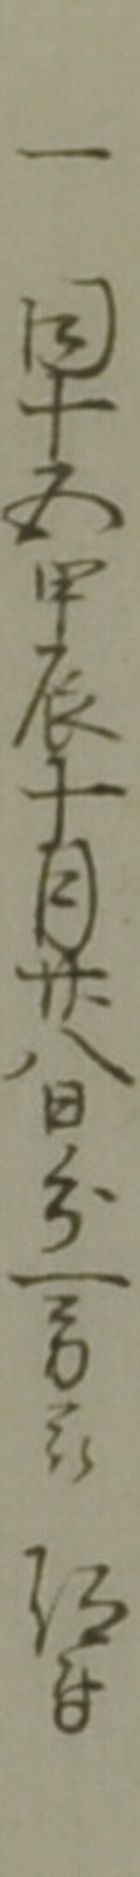一同十五甲辰十月廿八日分一方被仰付
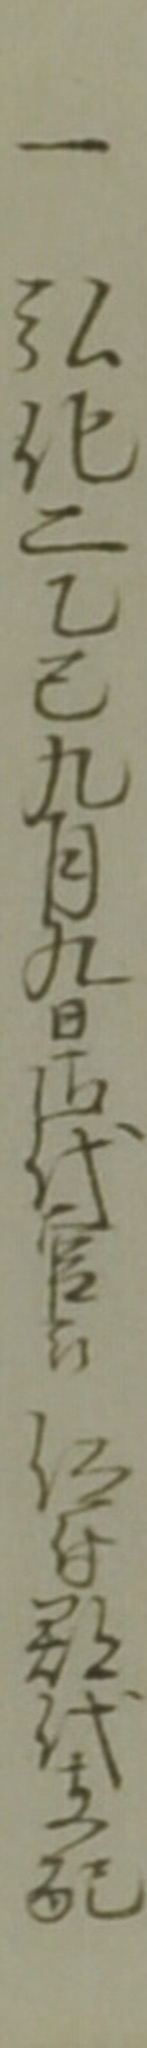一弘化二乙巳九月九日御代官被仰付郡代支配

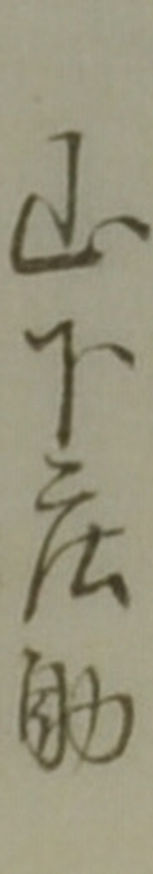山下庄助
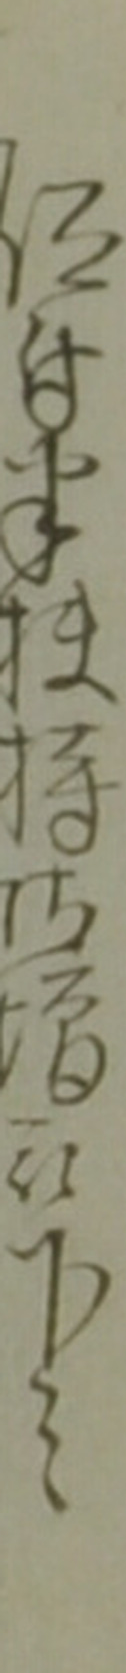仰付半扶持御増被下之
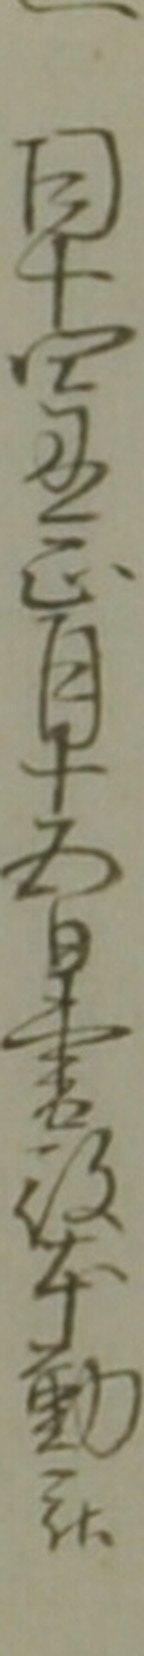一同十四丑正月十五日書役本勤被
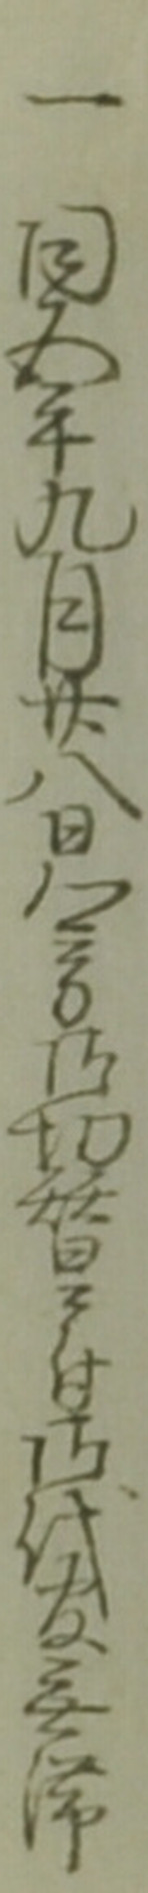一同五午九月廿八日郷方御切替ニ付御代官無滞
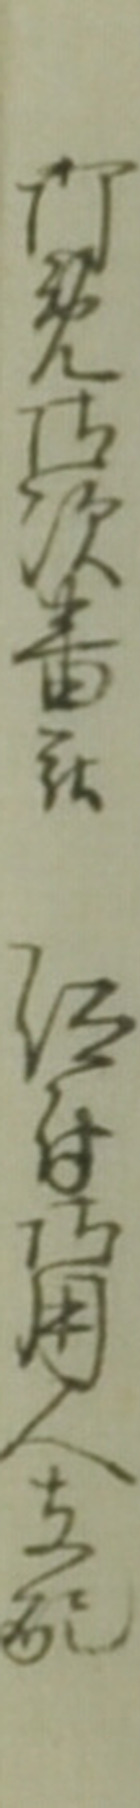御免御次番被仰付御用人支配
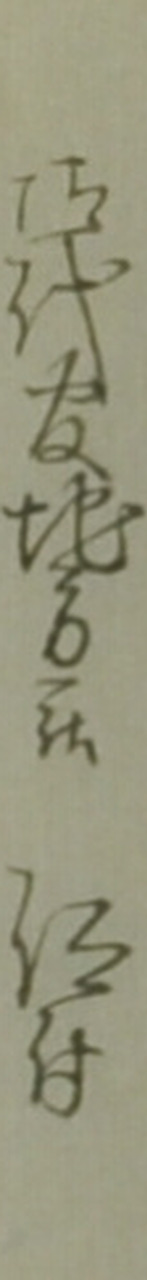御代官地方被仰付

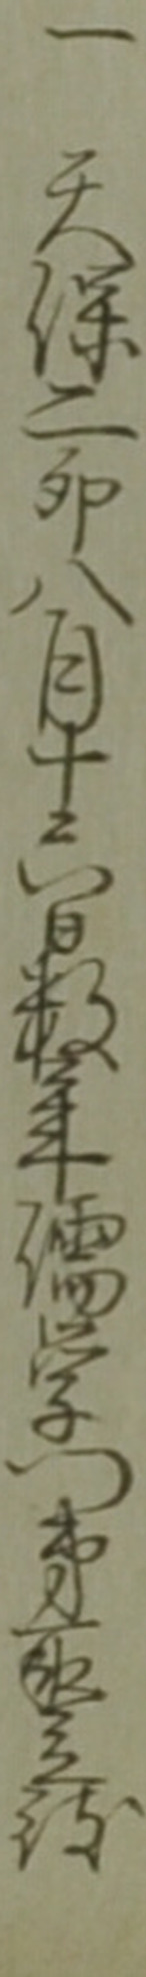一天保二卯八月十六日数年儒学門弟取立致
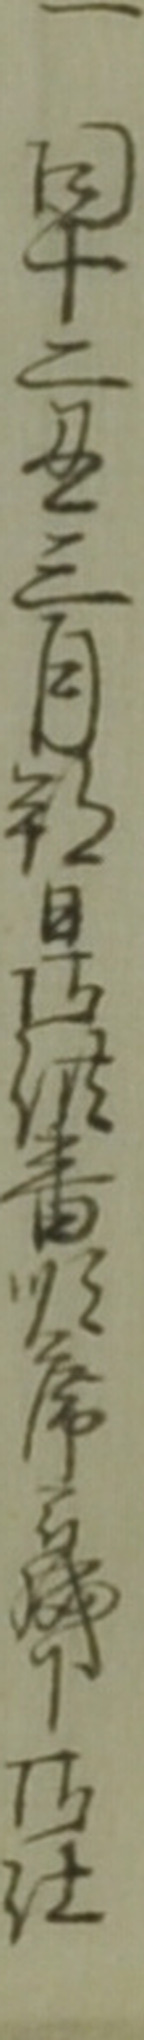一同十二丑三月朔日御供番順席被成下御仕
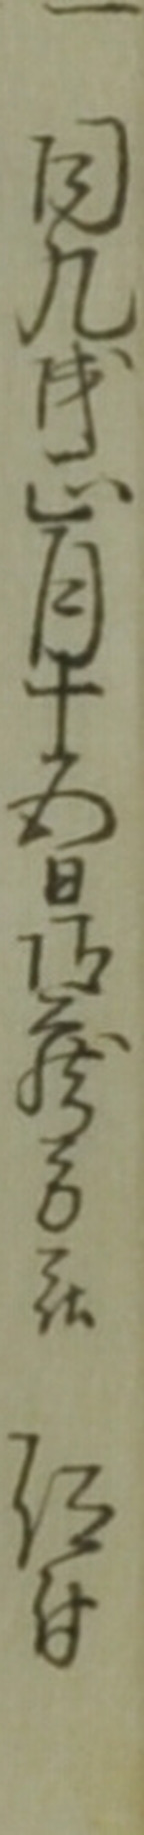一同九戌正月十五日御蔵方被仰付
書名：無足諸士勤仕録（二）
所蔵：伊那市立高遠町図書館・合同会社AMANE
